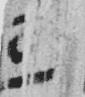或
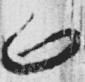㠯（以）
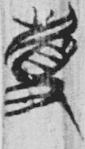○（文）
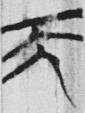而
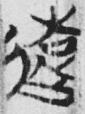遠
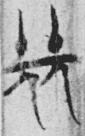堯
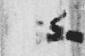之
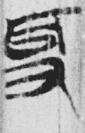取
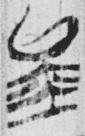○（舜）
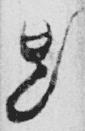也
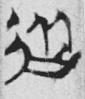從
